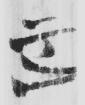正
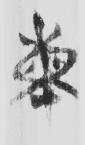柬
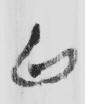㠯（以）
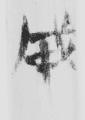成
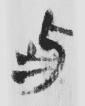此
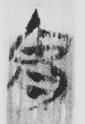胃
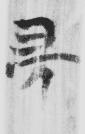𡵂
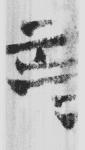正=
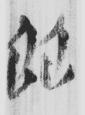{化化}
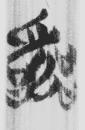{𤔔㗊}
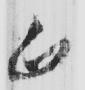㠯（以）
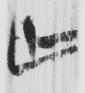亡
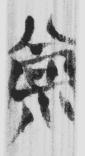常
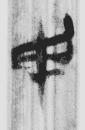民
